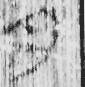月
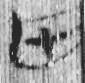甲
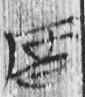晨
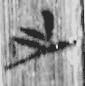之
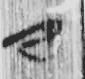日
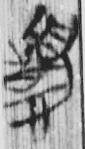○（喜）
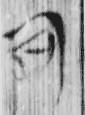司
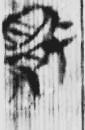敗
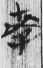李
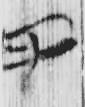○（聽）
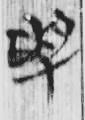受
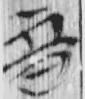○（期）
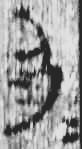十月
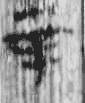辛
